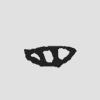四
